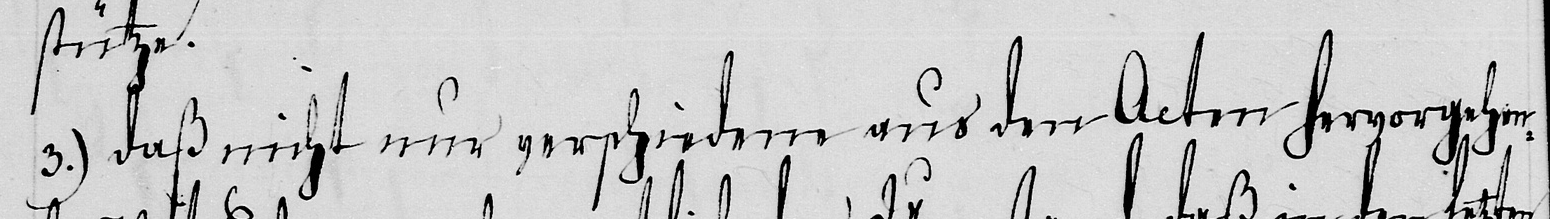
3.) daß nicht nur verschiedene aus den Acten hervorgehen¬
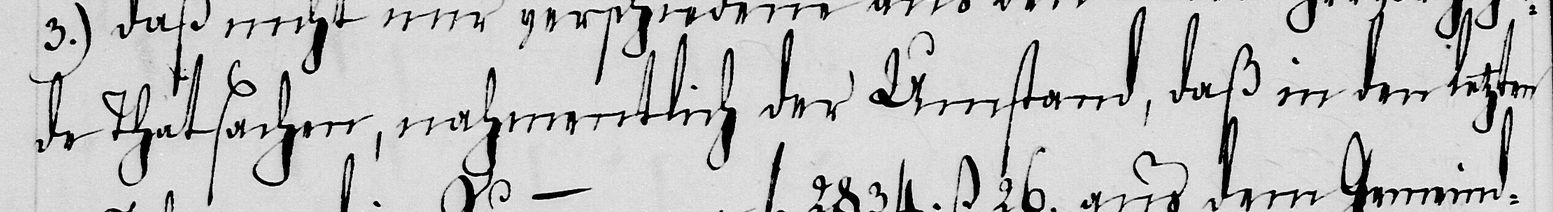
de Thatsachen, nahmentlich der Umstand, daß in den letz¬
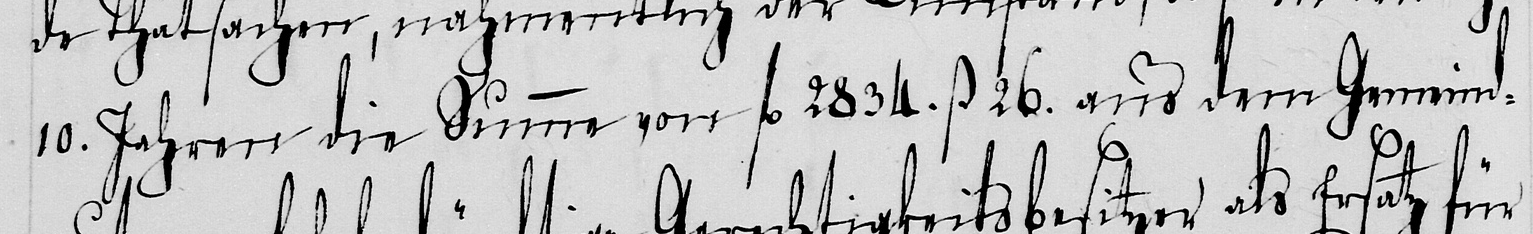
10. Jahren die Summe von fl. 2834. ß. 26. aus dem Gemeind¬
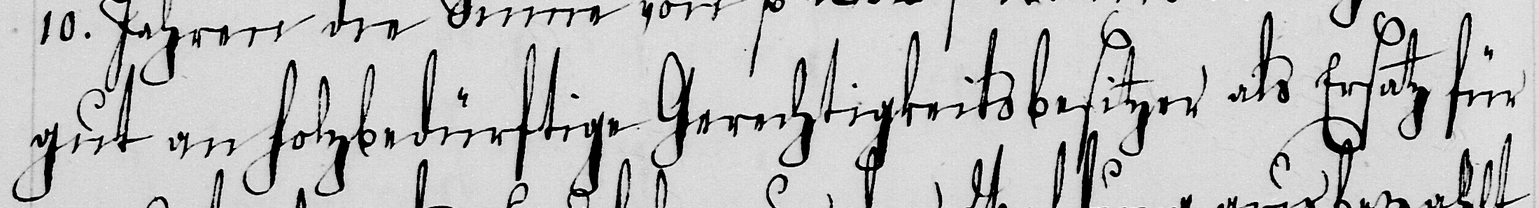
gut an Holzbedürftige Gerechtigkeitsbesitzer als Ersatz für
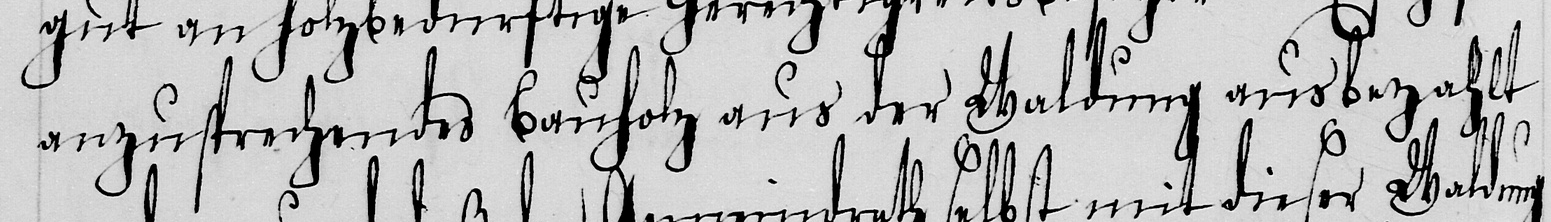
anzusprechendes Bauholz aus der Waldung ausbezahlt
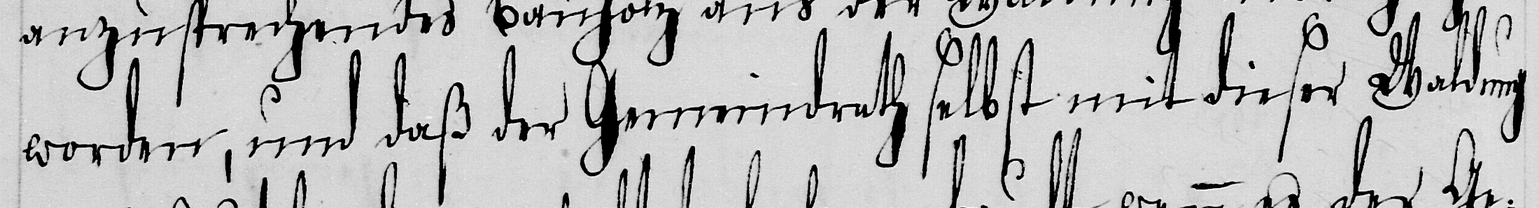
worden, und daß der Gemeindrath selbst mit dieser Waldung
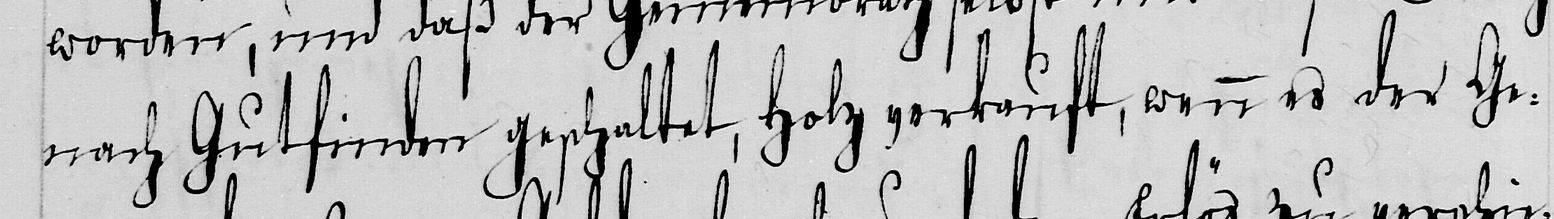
nach Gutfinden geschaltet, Holz verkauft, wenn es der Ge¬
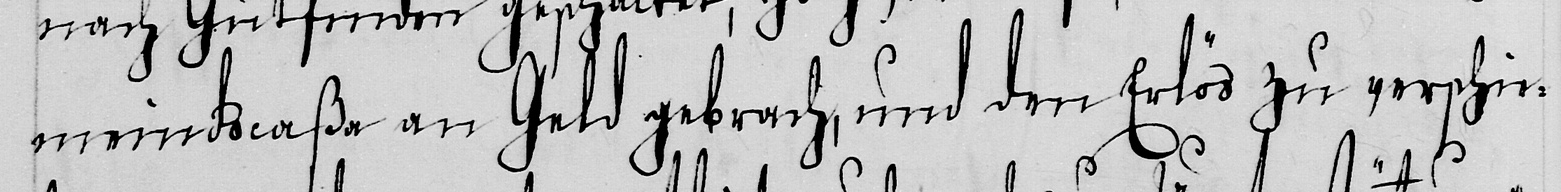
meindscaßa an Geld gebrach, und den Erlös zu verschie¬
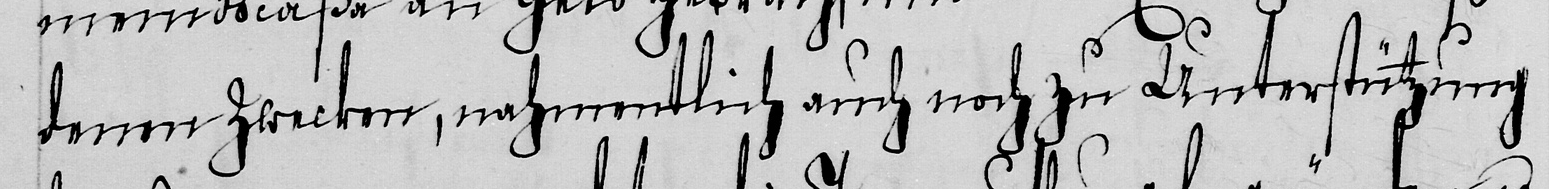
denen Zwecken, nahmentlich auch noch zu Unterstützung
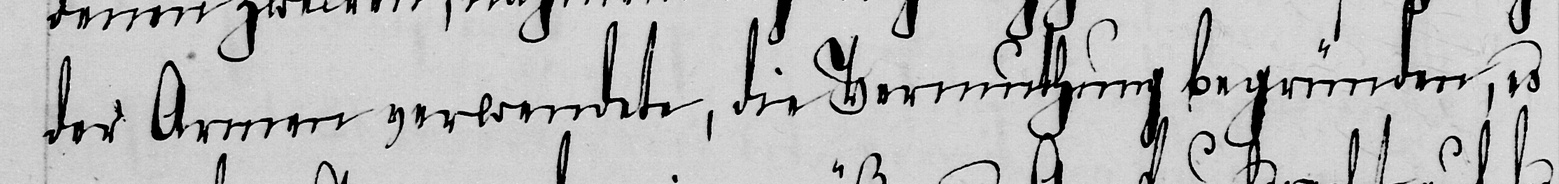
der Armen verwendete, die Vermuthung begründen, es
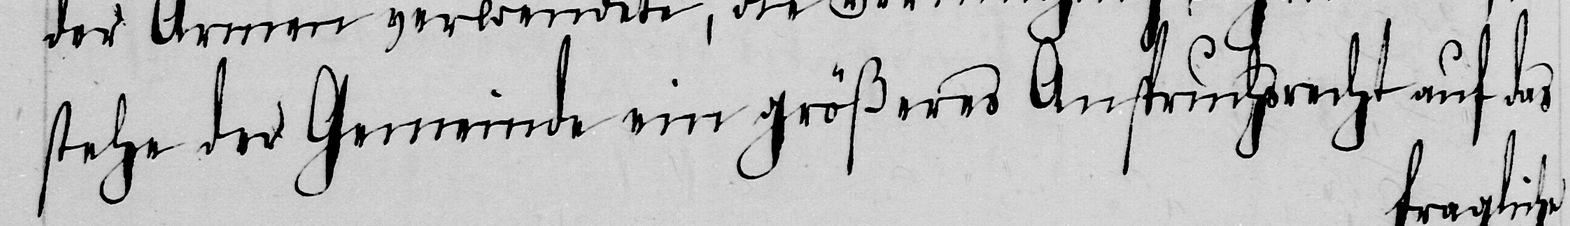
stehe der Gemeinde ein größeres Anspruchsrecht auf das
